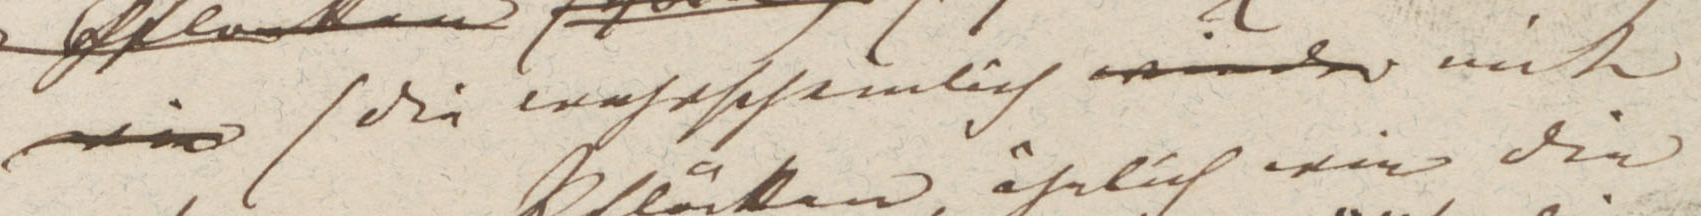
wie (die wahrscheinlich wie der mit
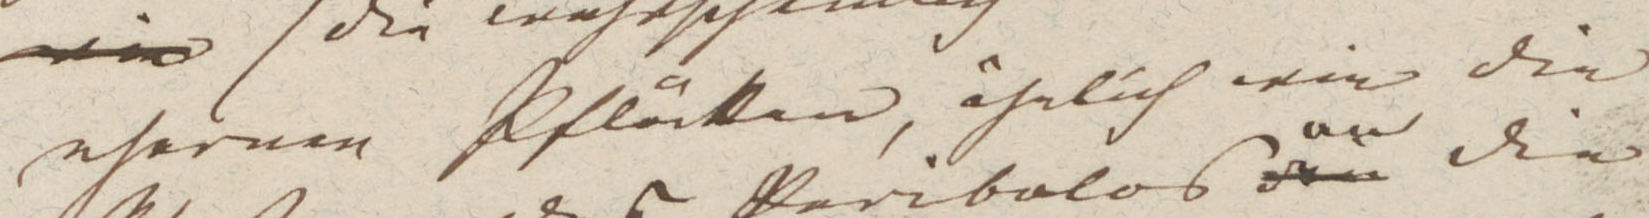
ehernen Pflöcken, ähnlich wie die
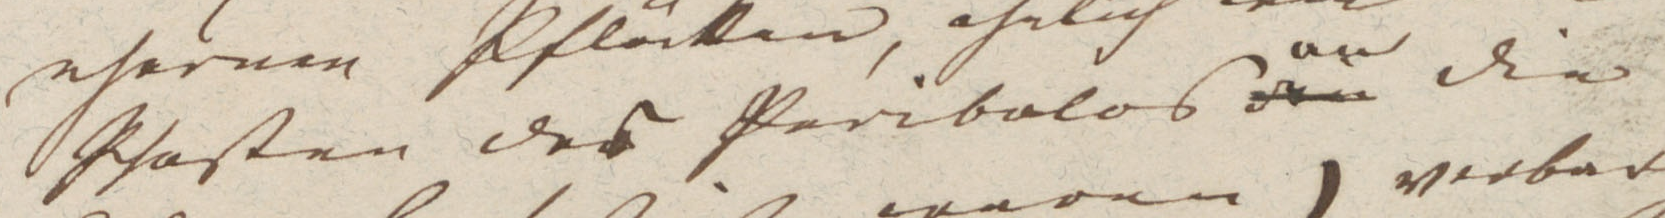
Pfosten ders Peribolos an die
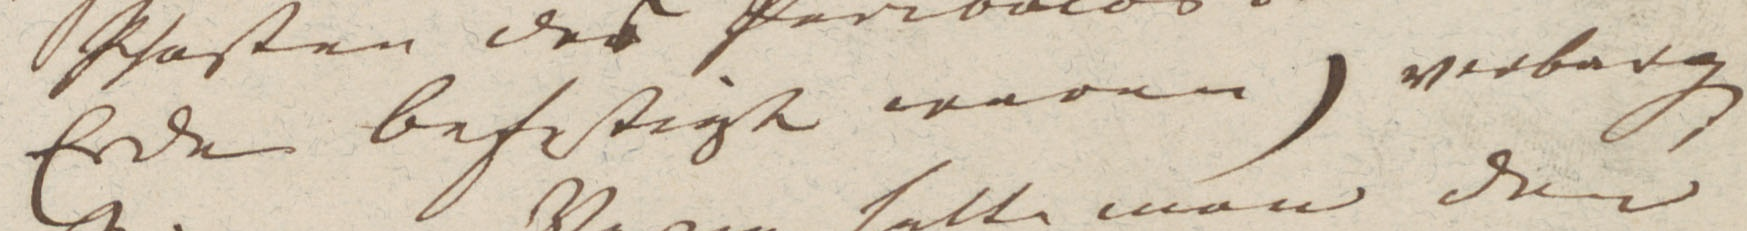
Erde befestigt waren) verbarg
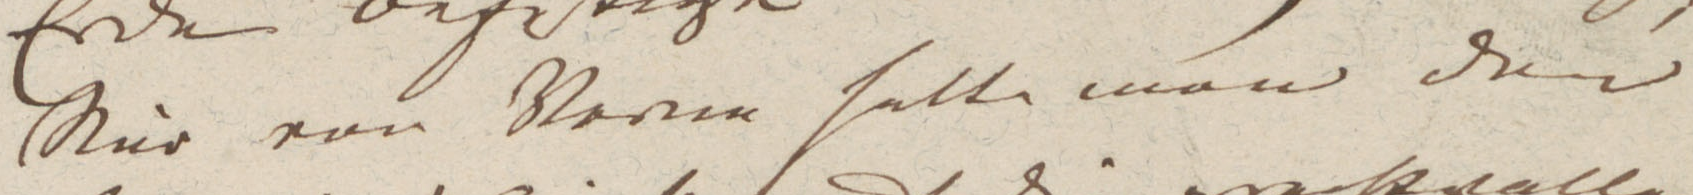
Nur von Vorne hatte man den
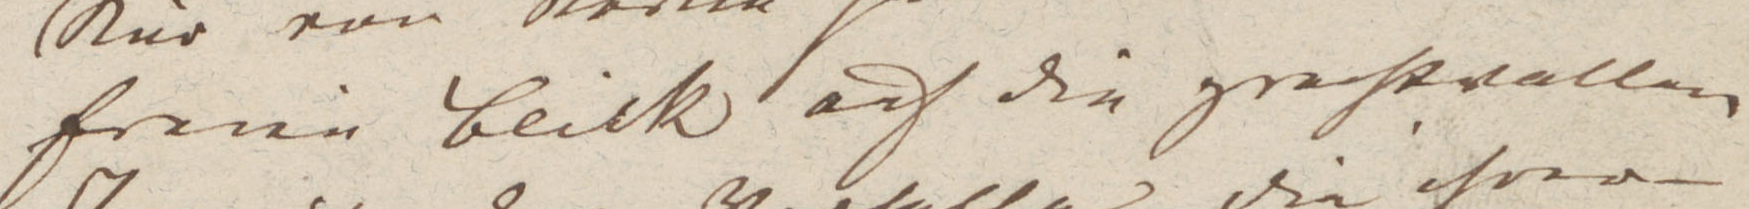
freien Blick auf die prachtvollen
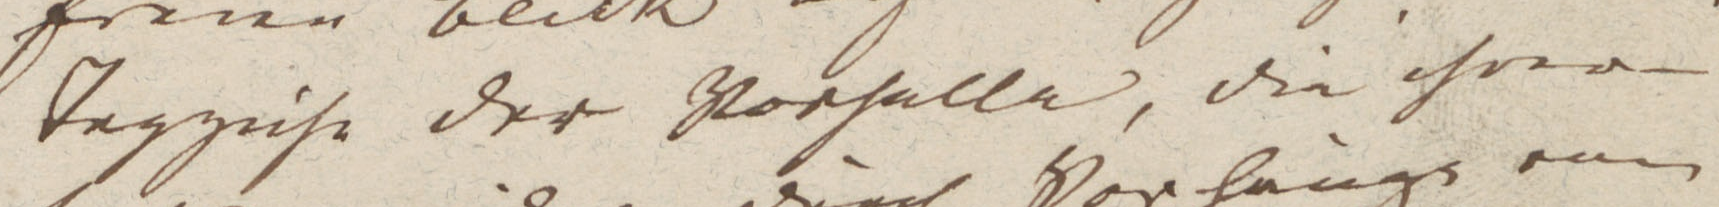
Teppiche der Vorhalle, die ihrer-
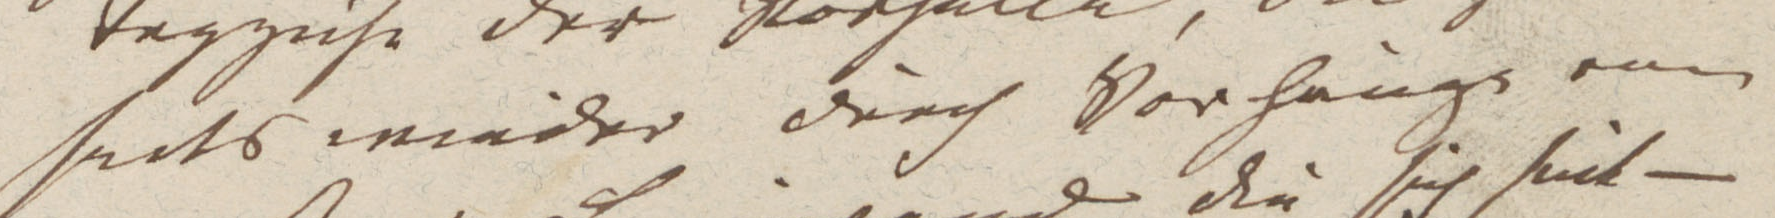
seits wieder durch Vorhänge von
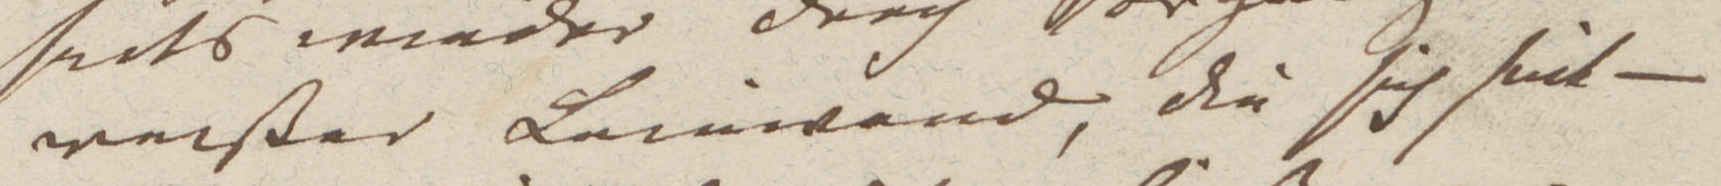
weisser Leinwand, die sich seit-
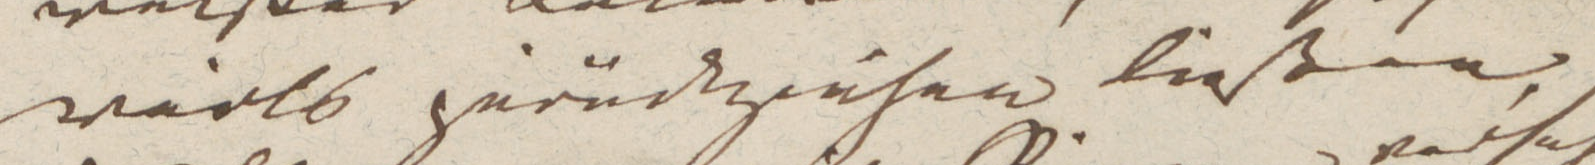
wärts zurückziehen liessen,
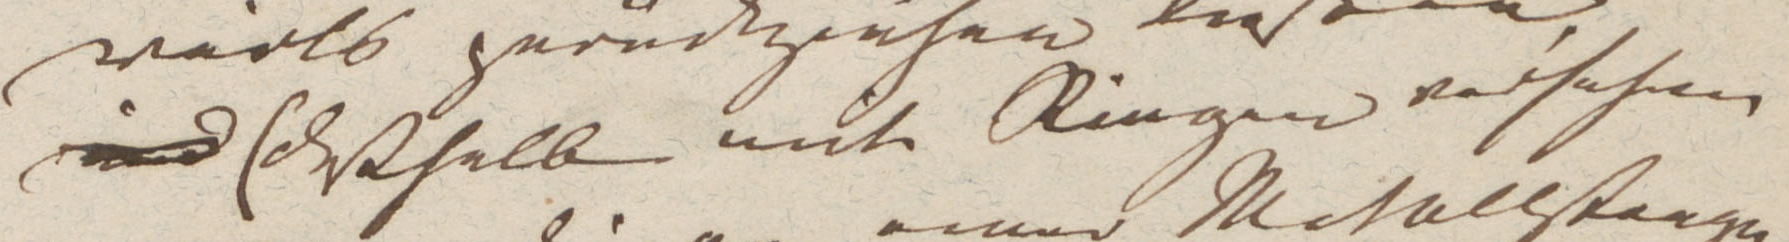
und (desshalb mit Ringen versehen
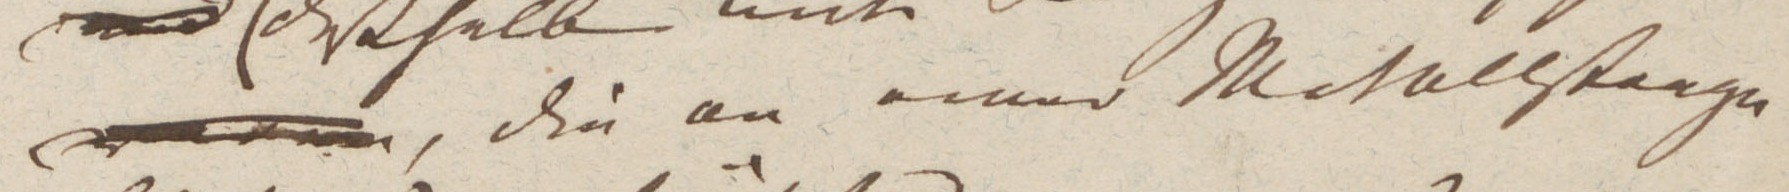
waren, die an einer Metallstange
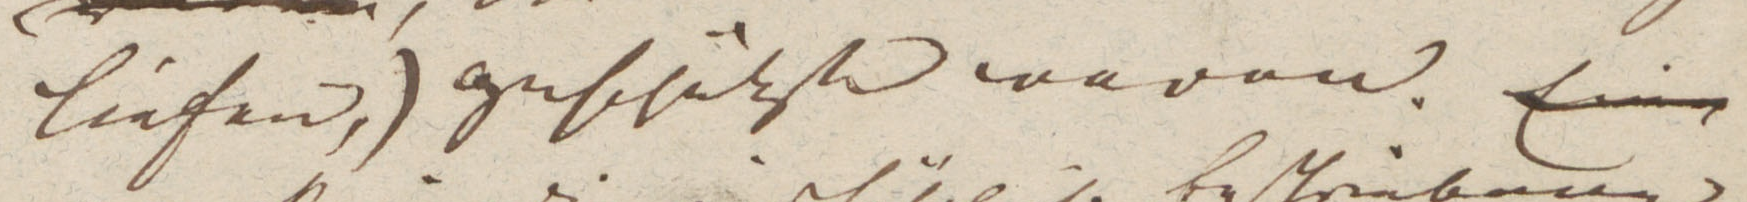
liefen,) geschätzt waren. Eine
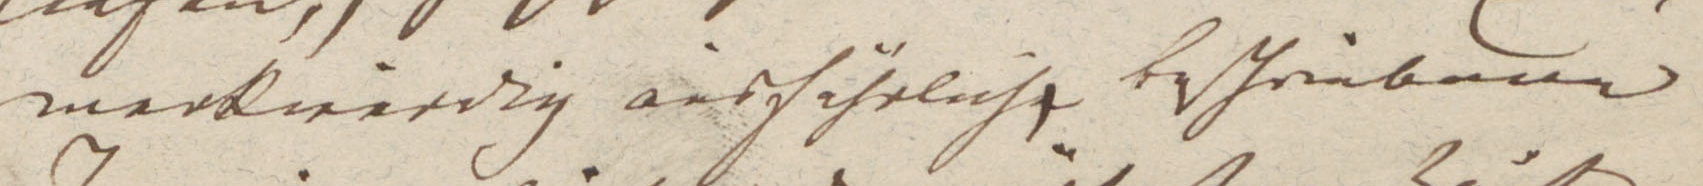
merkwürdig ausführliche beschriebene
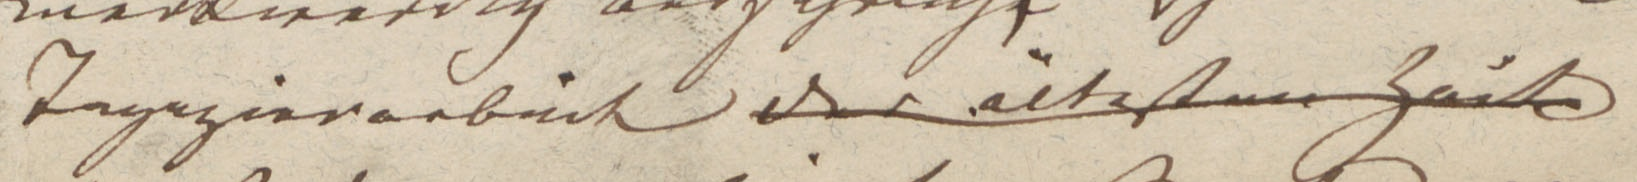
Tapezierarbeit der ältesten Zeit
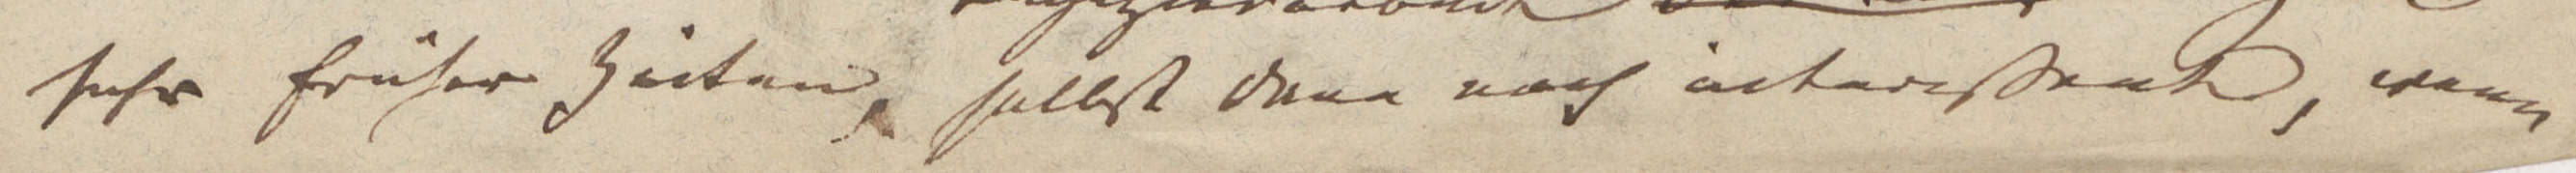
sehr früher Zeiten, selbst dann noch interessant, wenn
